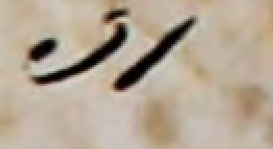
31
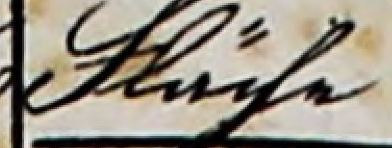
Fläche
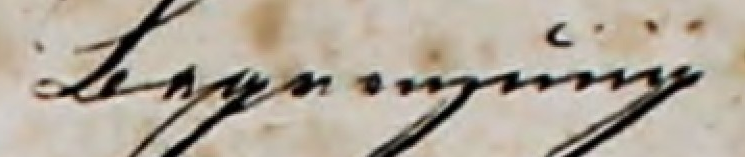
Begrenzung
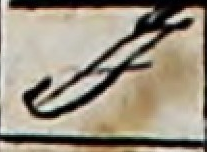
J.
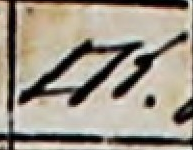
Ck.
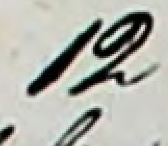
12
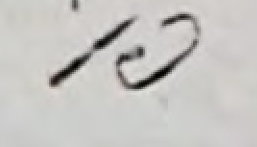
13
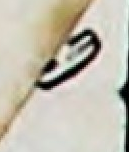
33
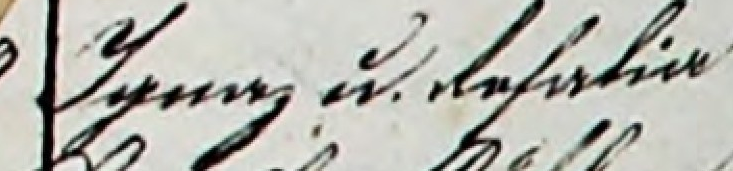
Ignaz u. Rosalia
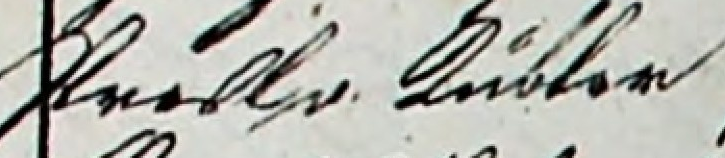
Presl v. Kübler
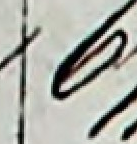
6
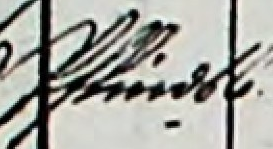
Pflindsb.
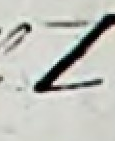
I
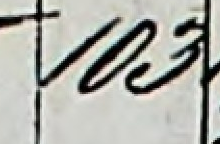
103
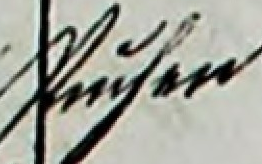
Puchen
